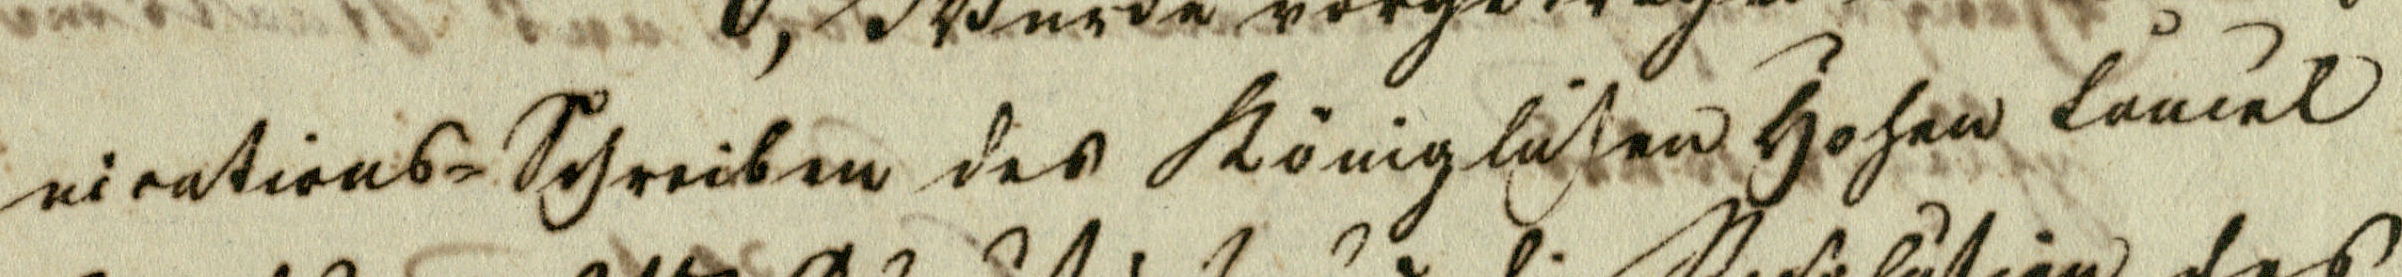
nications-Schreiben des Königlichen Hohen Cancel¬
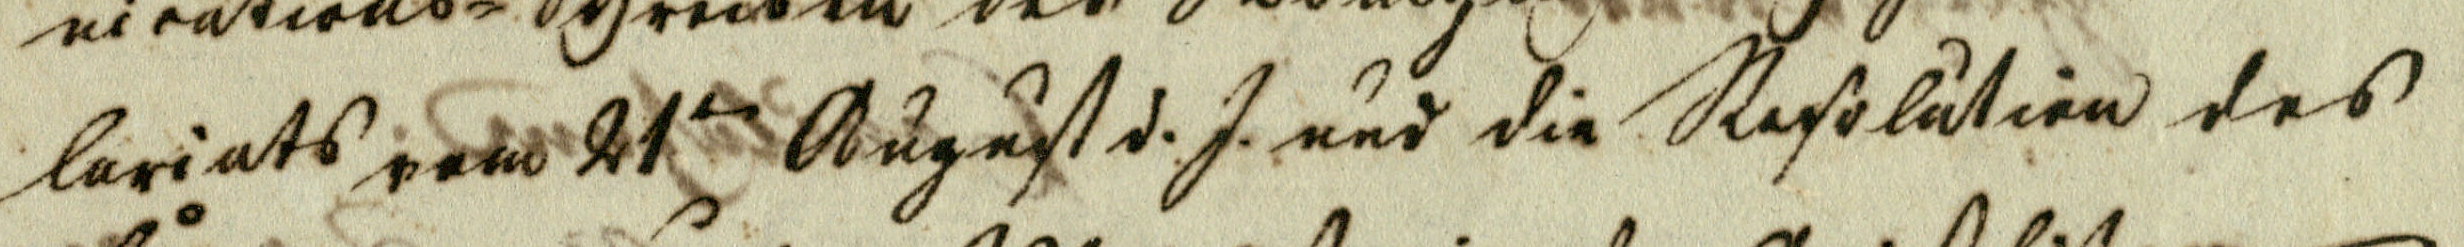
lariats vom 21 t August d. J. und die Resolution des
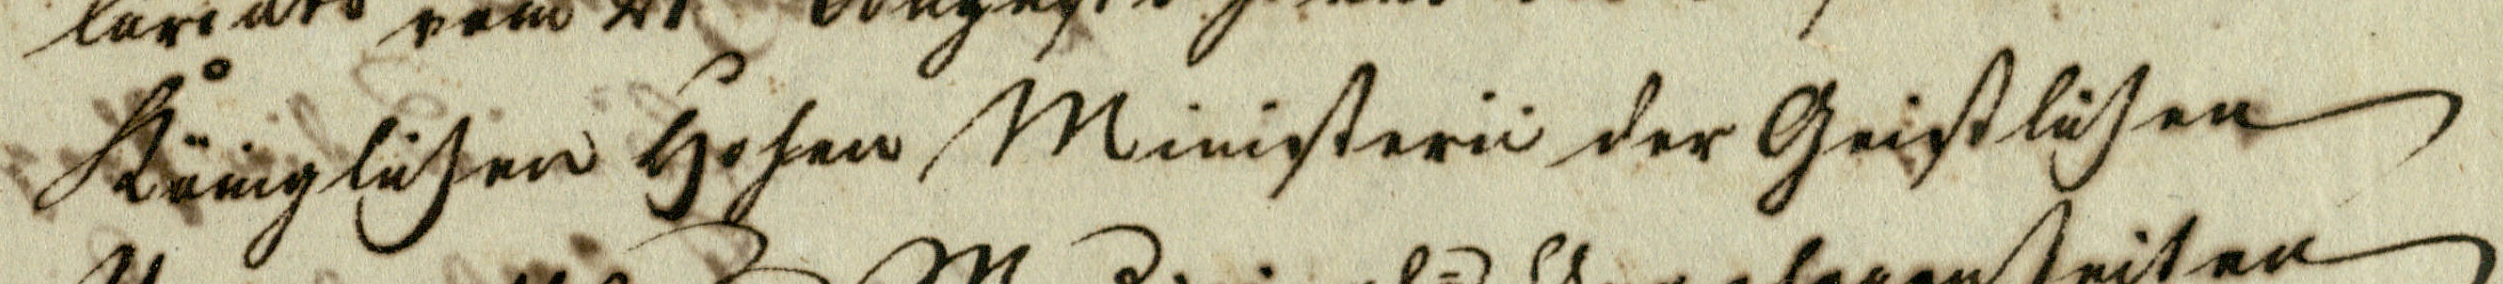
Königlichen Hohen Ministerii der Geistlichen
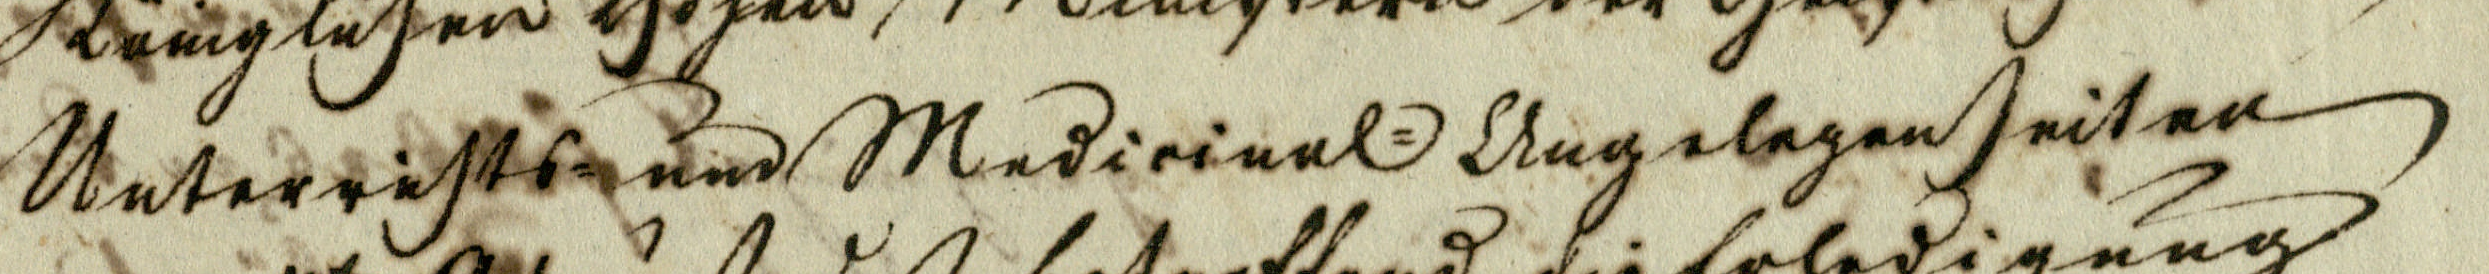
Unterrichts und Medicinal- Angelegenheiten
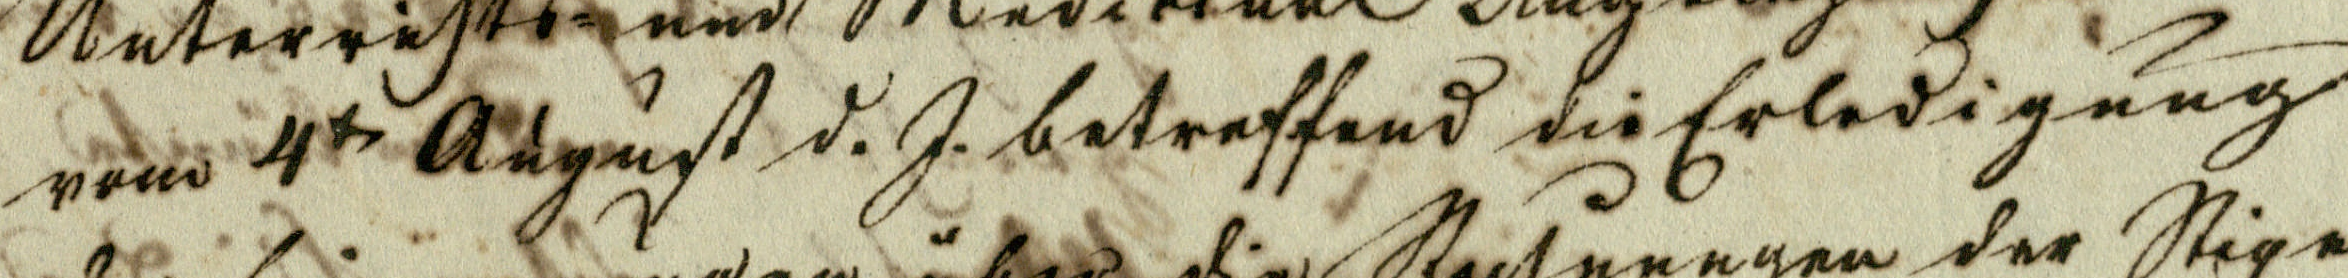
vom 4 August d. J. betreffend die Erledigung
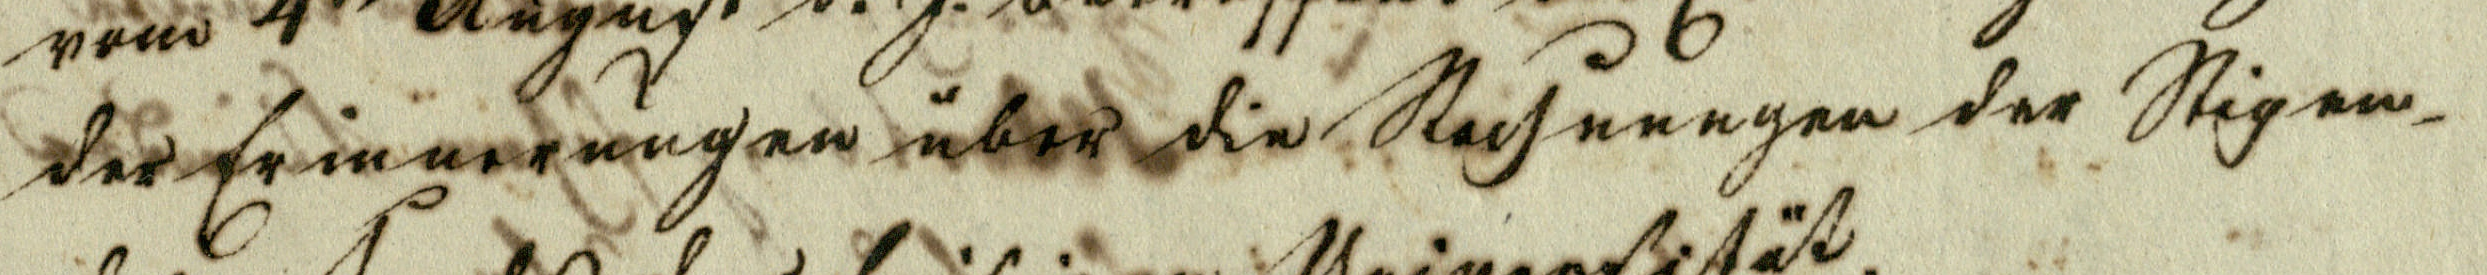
der Erinnerungen über die Rechnungen der Stipen¬
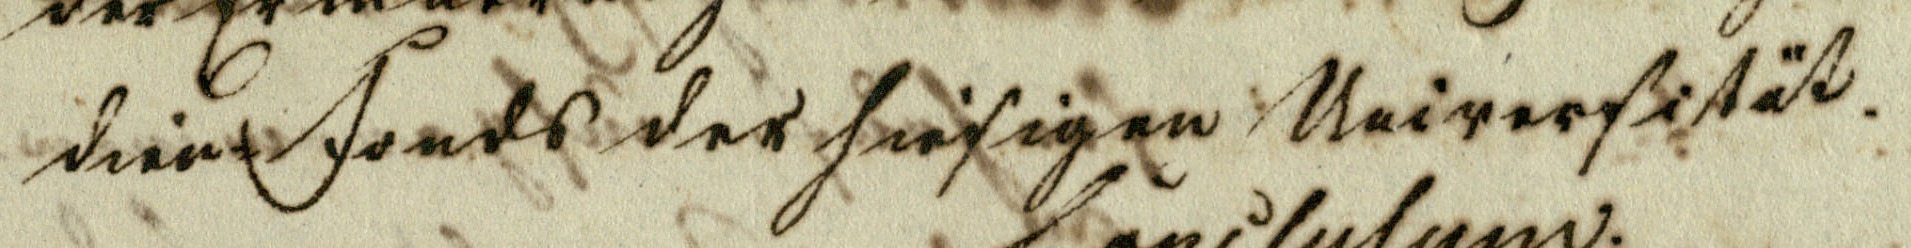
dien Fonds der hiesigen Universität.
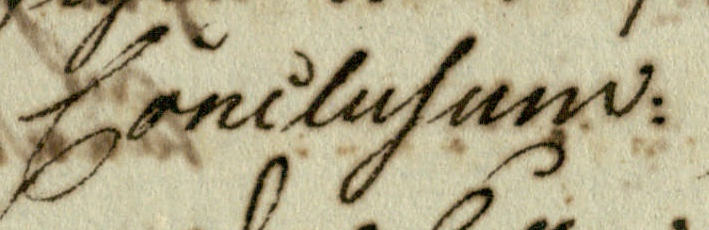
Conclusum:
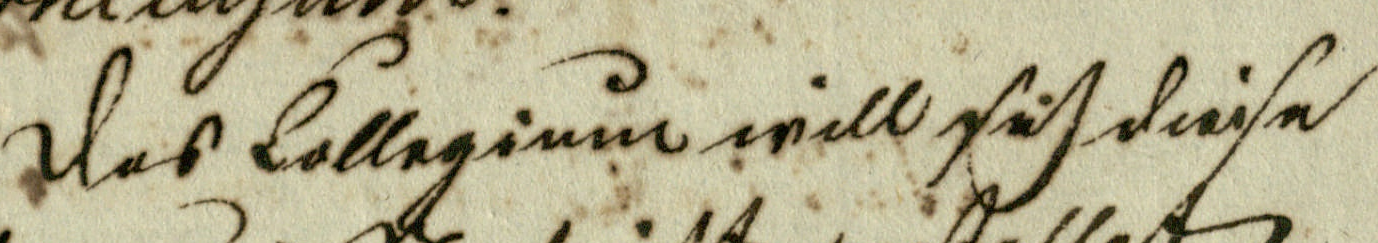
Das Collegium will sich diese
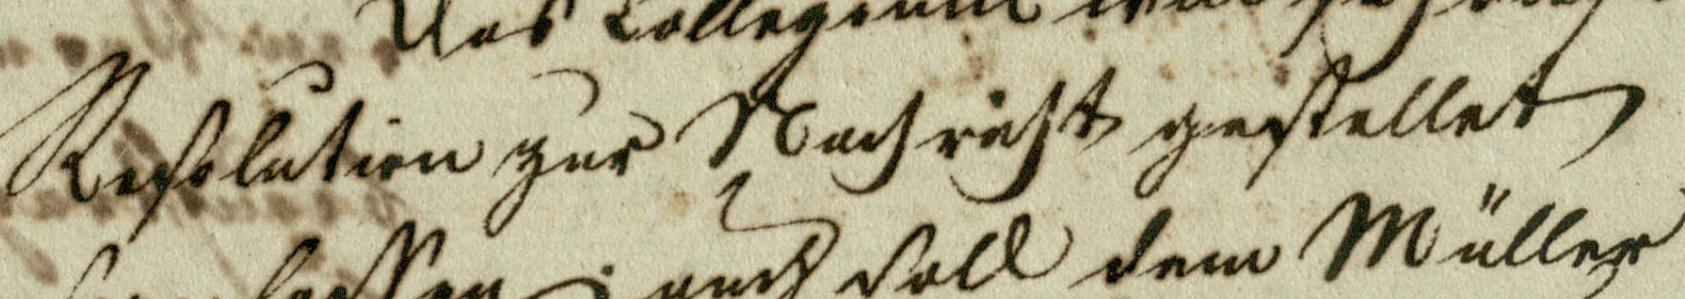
Resolution zur Nachricht gestellet
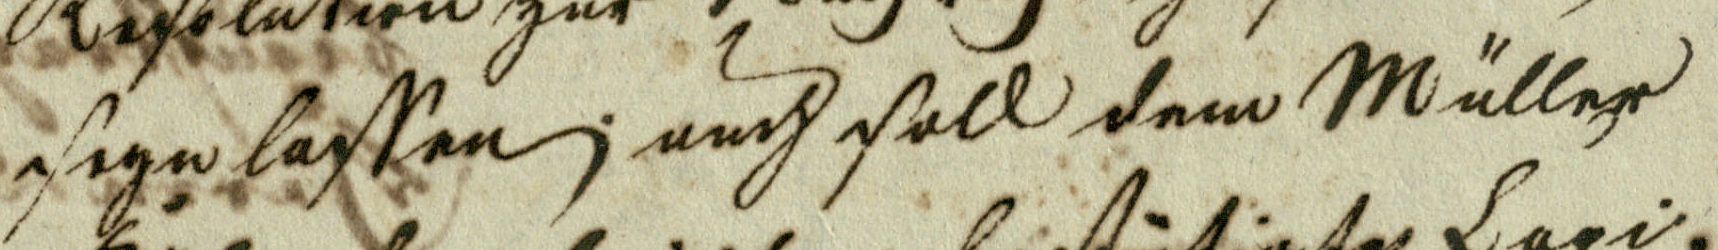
seyn lassen; auch soll dem Müller
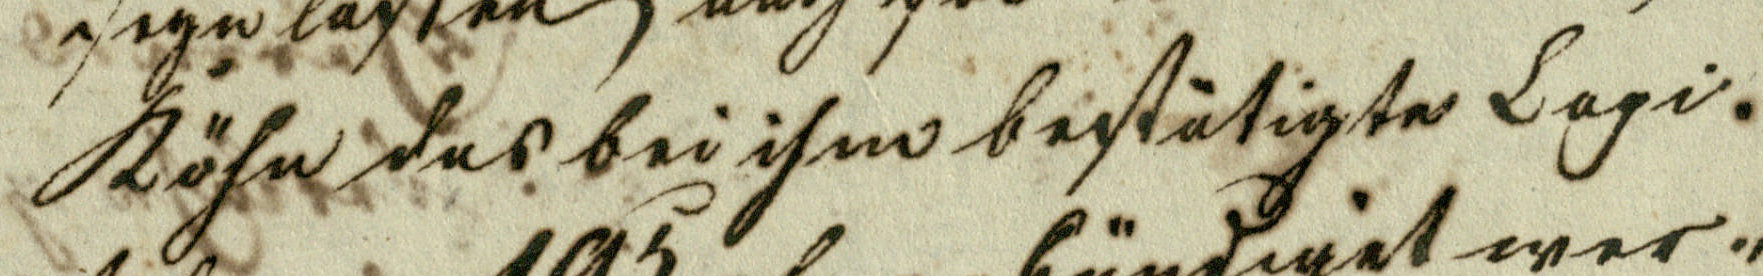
Köhn das bei ihm bestätigte Capi¬
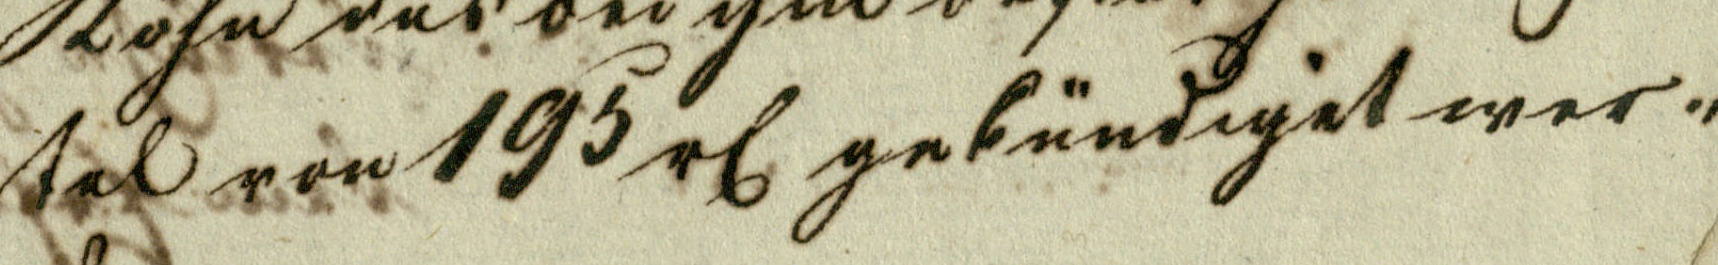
tal von 195 rl, gekündiget wer¬
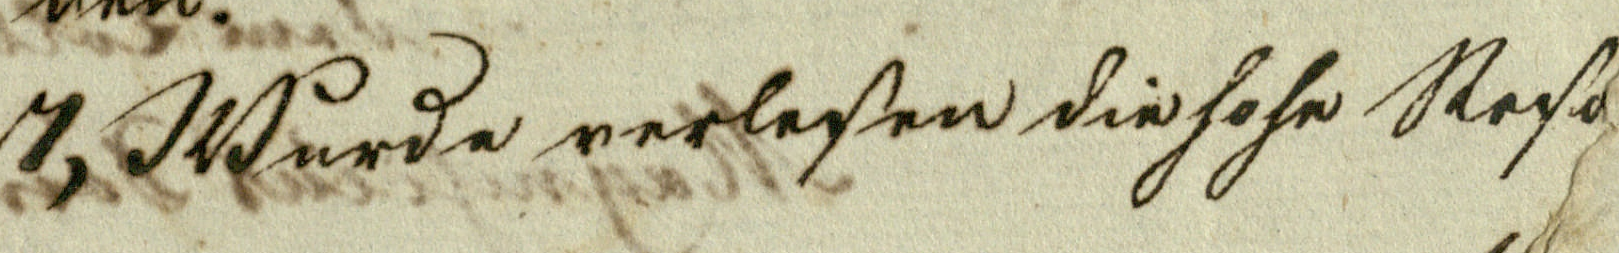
7, Wurde verlesen die hohe Reso
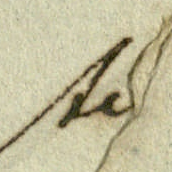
ti
